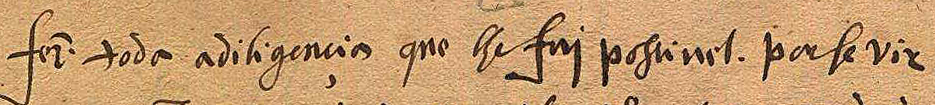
fez toda a diligencia que lhe fuj possiuel. por se vir
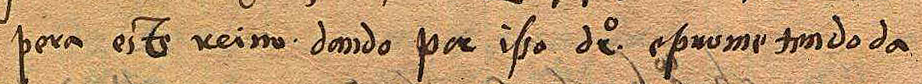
pera este reino dando por isso dro. e prometendo da
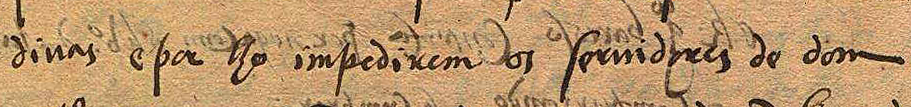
diuas e por lho impedirem os seruidores de dom
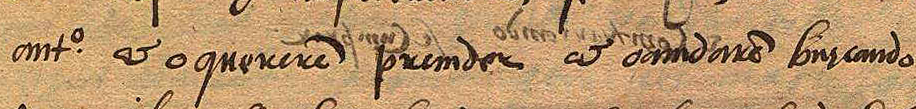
anto. & o quererē premder & o amdarā buscando
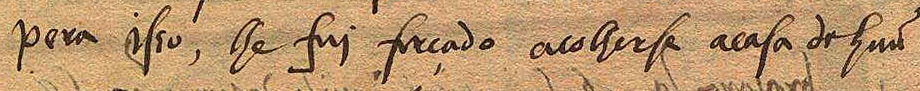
pera isso, lhe fuj forçado acolherse a casa de huū
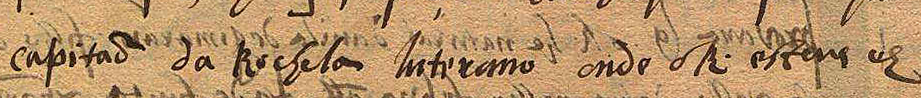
capitão da Rochela luterano onde o R. esteue es
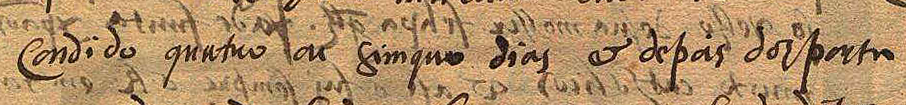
Condido quatro ou simquo dias & depois dos portu
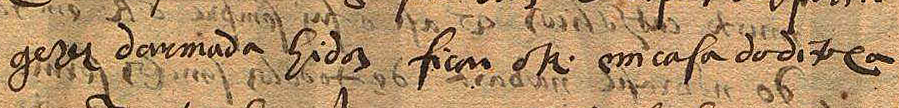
gezes darmada hidos ficou o R. em casa do dito Ca
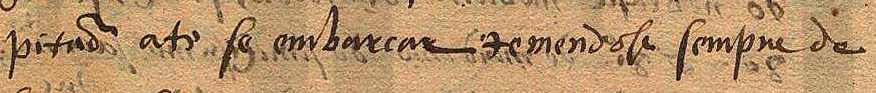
pitão ate se embarcar temendose sempre de
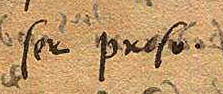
ser preso.
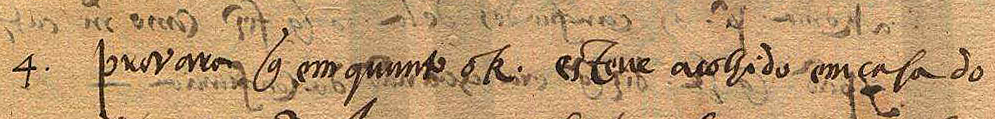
4. provara q̄ emquanto o R. esteue acolhido em casa do
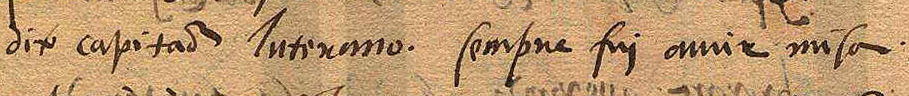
dito capitão luterano. sempre fuj ouuir misa
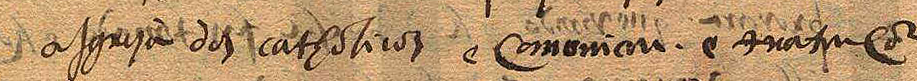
a Jgreja dos catholicos e Comonicou e tratou Cō
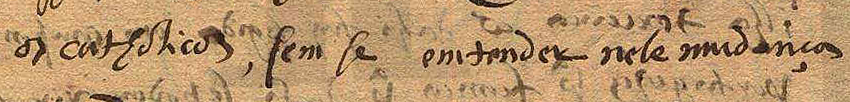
os catholicos, sem se emtender nele mudança
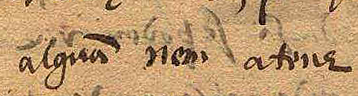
alguā nem a teue
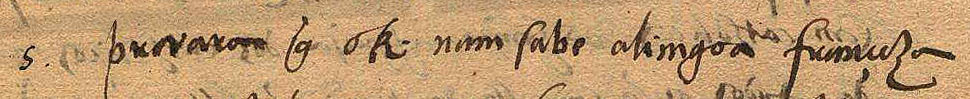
5. provara q̄ o R. nam sabe a limgoa franceza
